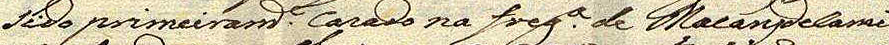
sido primeiram.e cazado na freg.a de Macans de Cami
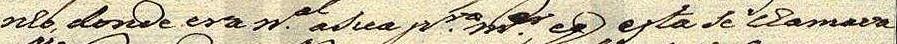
nho, donde era n.al a sua p.ra m.er e q̄ esta se chamava
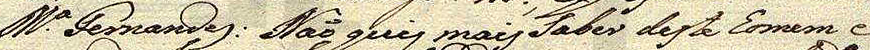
M.a Fernandes: Naõ quis mais saber deste homem e
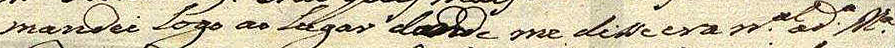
mandei Logo ao lugar donde me disse era n.al a d.a M.a
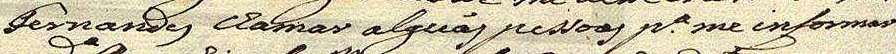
Fernandes chamar alguās pessoas p.a me informar
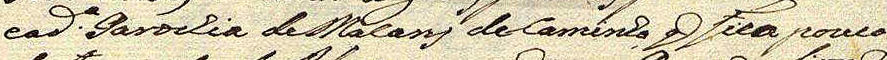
e a d.a Parochia de Macans de Caminho, q̄ fica pouco
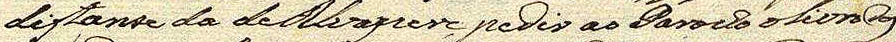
distante da de Alvayzere pedir ao Parocho o livro dos
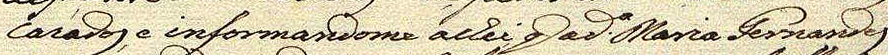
cazados, e informandome achei q̄ a d.a Maria Fernandes
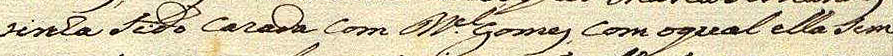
tinha sido cazada com M.el gomes, com o qual ella sem
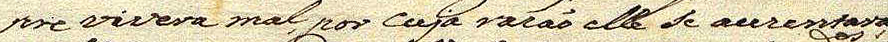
pre vivera mal, por cuja razaõ elle se auzentara,
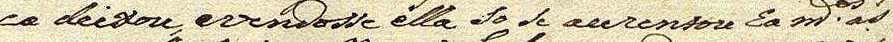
e a deixou, e vendosse ella so se auzentou ha m.os a.s
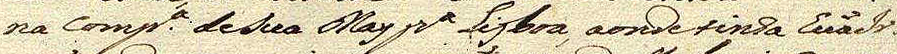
na comp.a de sua May pa Lisboa, aonde tinha huā Ir
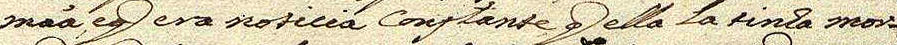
maā, e q̄ era noticia constante q̄ ella La tinha mor
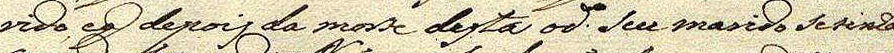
rido, e q̄ depois da morte desta o d.o seu marido se tinha
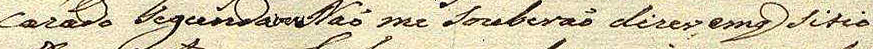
cazado segunda vez Naõ me souberaõ dizer em q̄ sitio
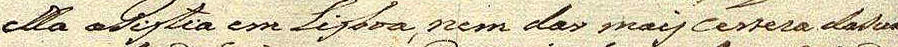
ella asistia em Lisboa, nem dar mais certeza da sua
